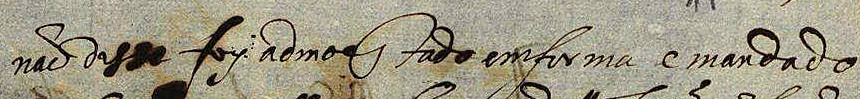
naõ disse foy admoestado em forma e mandado
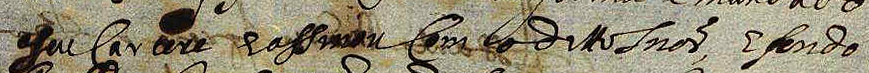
a seu Carcere E assinou Com o ditto Snor̄, E sendo
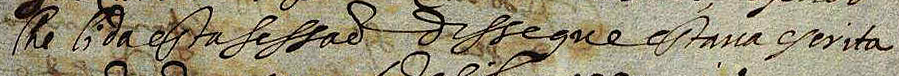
lhe lida esta sessaõ disse que estaua escrita
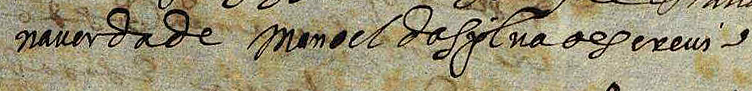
na uerdade manoel da sylua o escreui
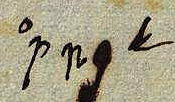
po ngr
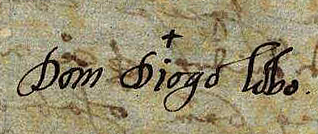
Dom Diogo lobo
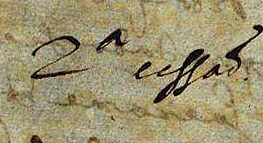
2a cessaõ
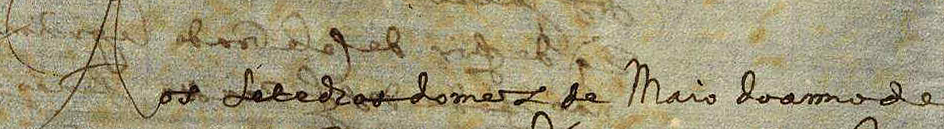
Aos sete dias do mez de Maio do anno de
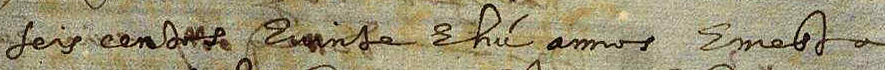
seiscentos E uinte E hū annos Em esta
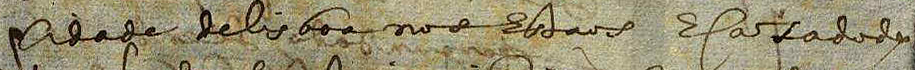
Cidade de lisboa nos Estaos E Caza do des
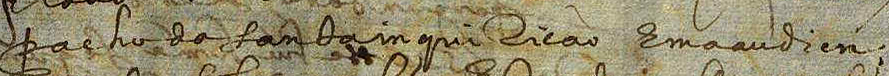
pacho da santa inquiziçaõ Em a audien
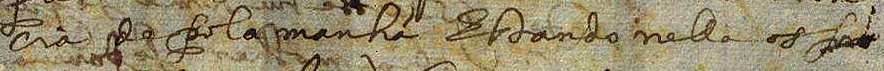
cia de pola manhā Estando nella os sor_
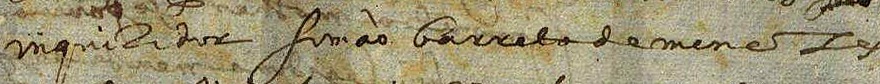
inquizidor simaõ barreto de menezes
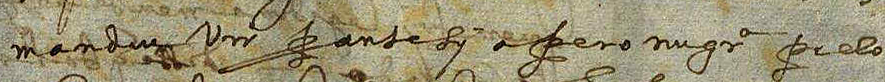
mandou vir ꝑante sy a pero nugra preso
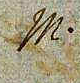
m.
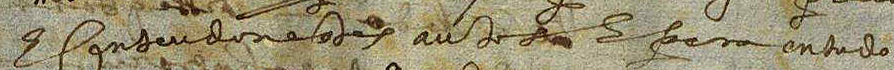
E Conteudo nestes autos E pera en tudo
